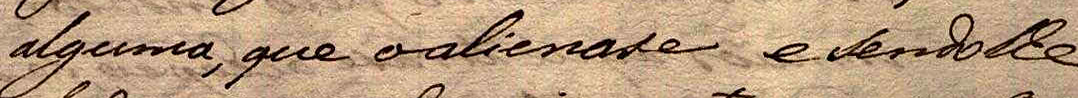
alguma, que o alienase e sendolhe
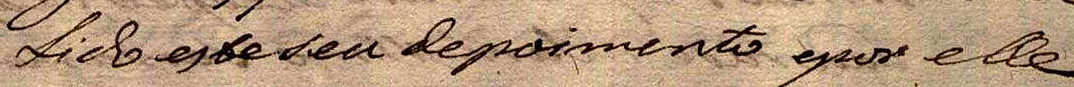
Lido este seu depoimento e por elle
